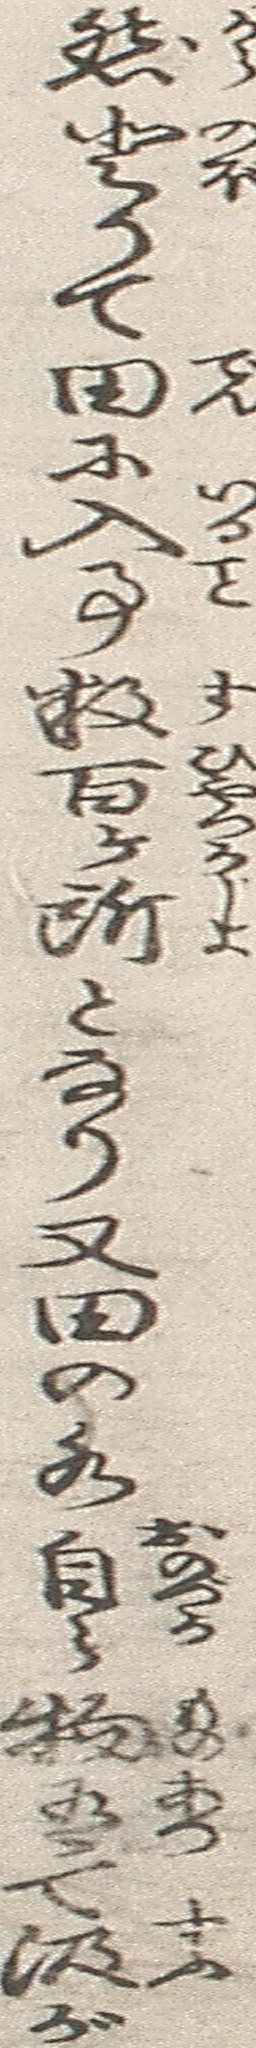然登りて田に入事数百ヶ所となり又田の水自ら物有て汲が
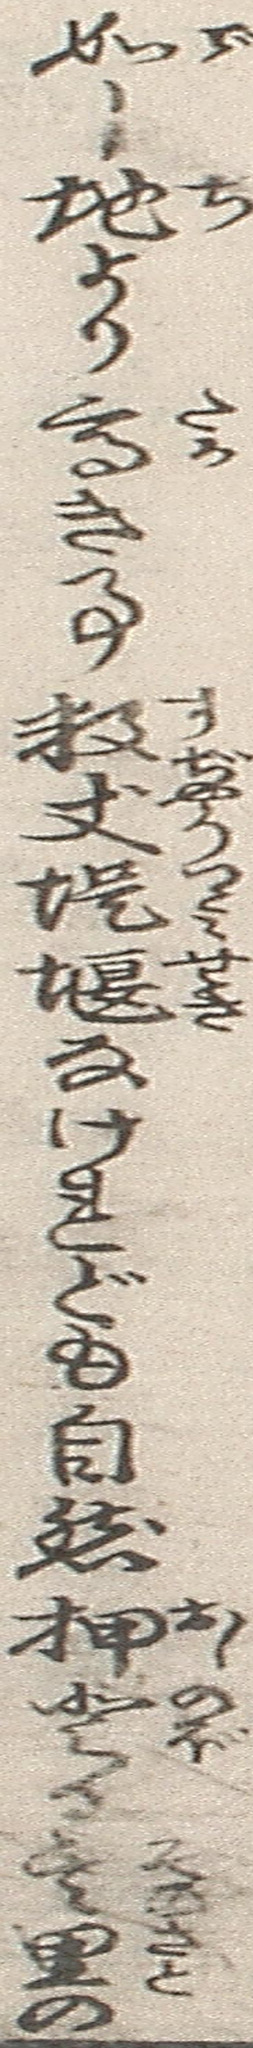如し地より高き事数丈堤堰なけれども自然押登り其里の
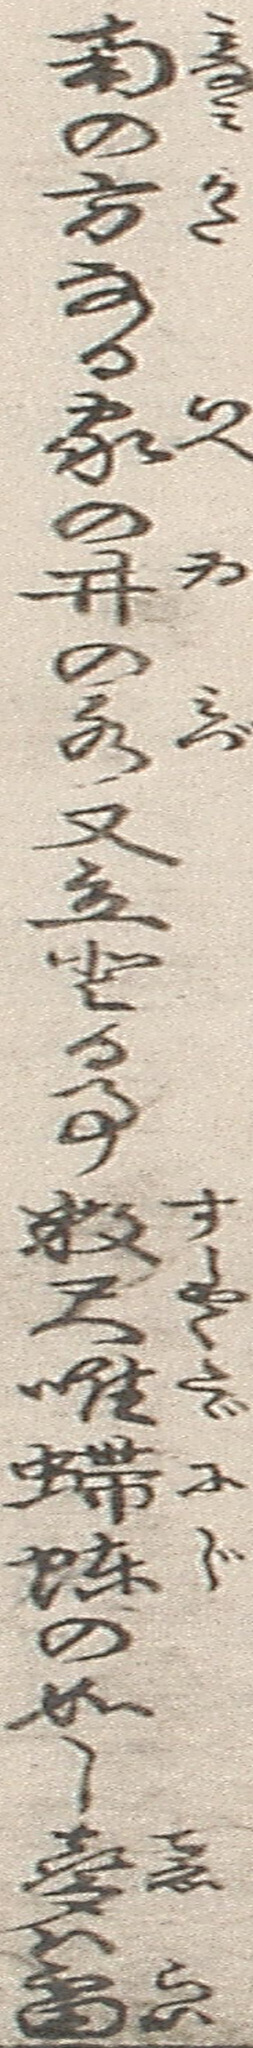南の方なる家の井の水又立登る事数尺唯螮蛼の如し声ハ雷
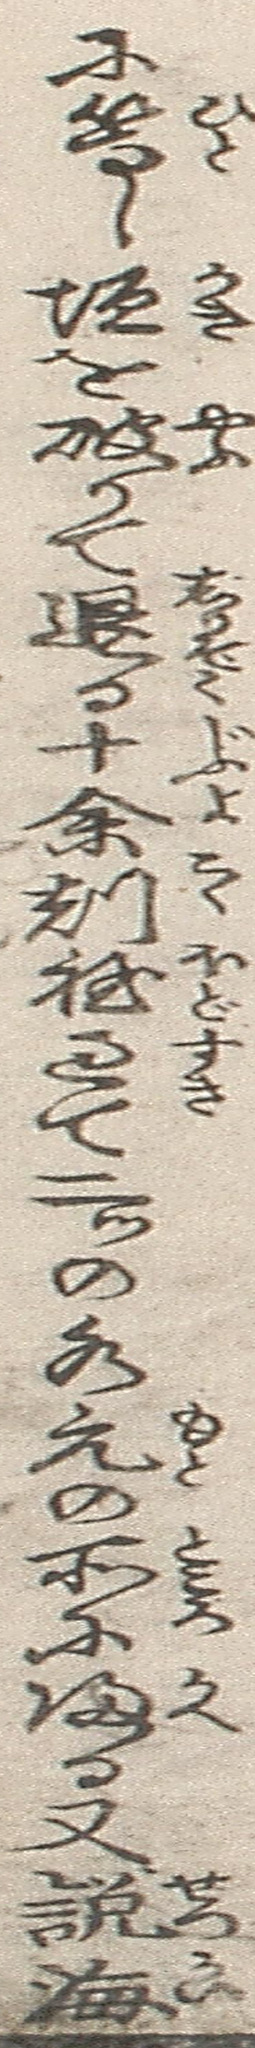に等し垣を破りて退る十余刻程過て二ッの水元の所に歸る又説海
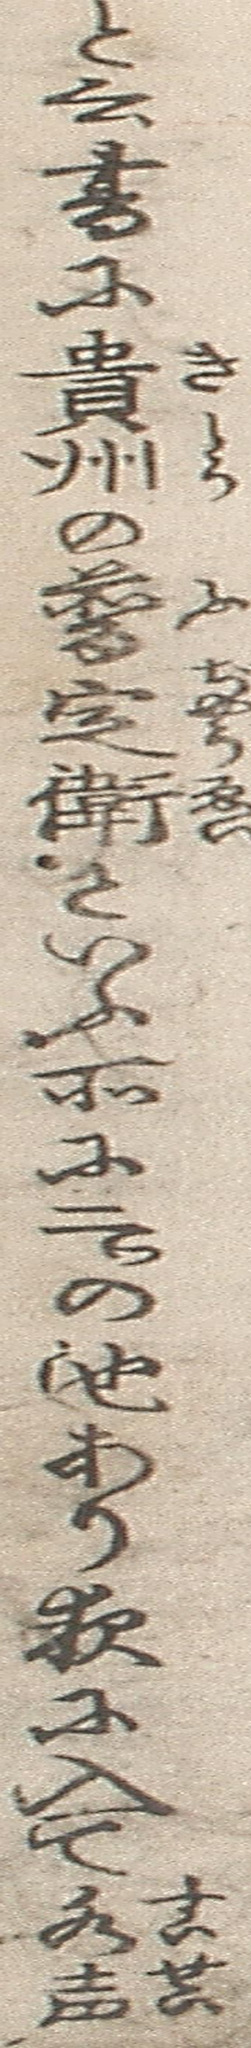と云書に貴州の普定衛といふ所に二ッの池あり夜に入て水声

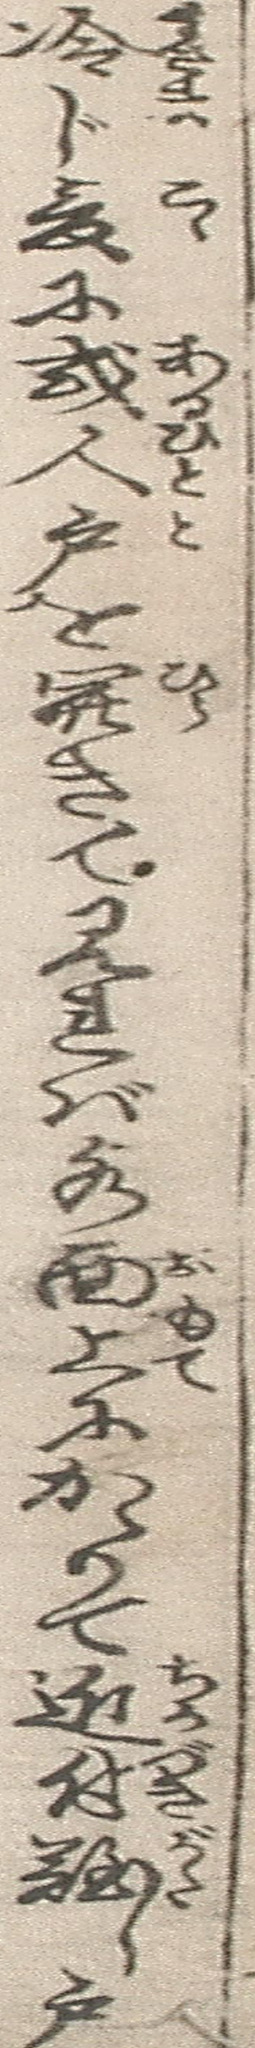冷じ爰に或人戸を開きて見れバ水面上にかゝりて近付難し戸
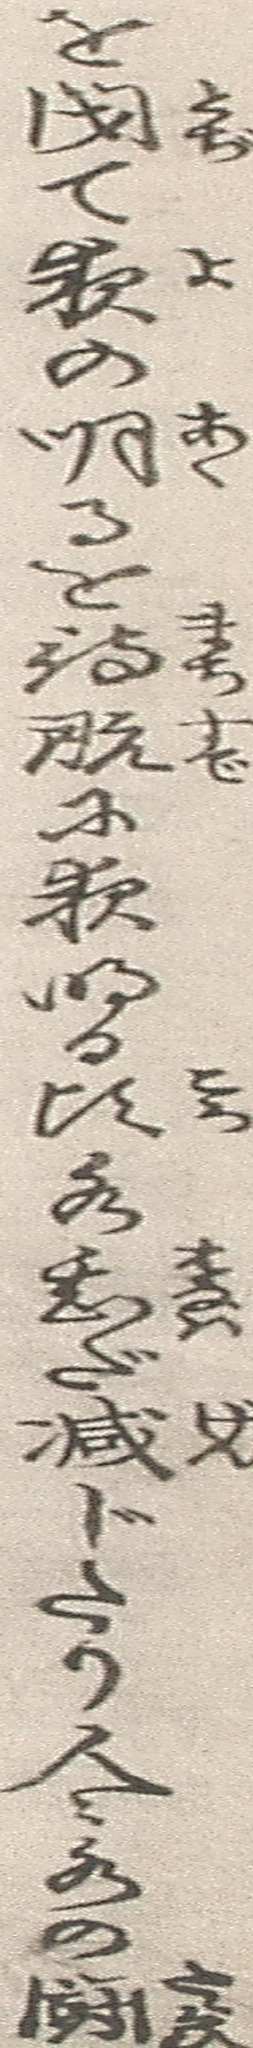を閉て夜の明るを待既に夜明る頃水甚だ減じたり人々水の闘
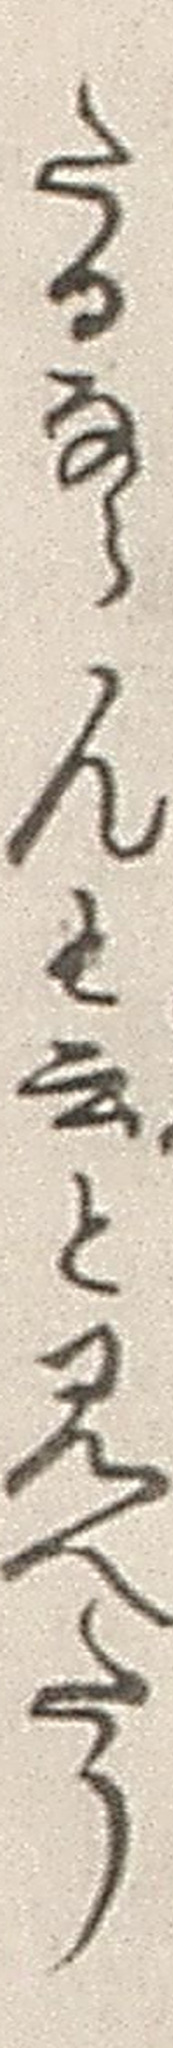たるならんと云と見へたり
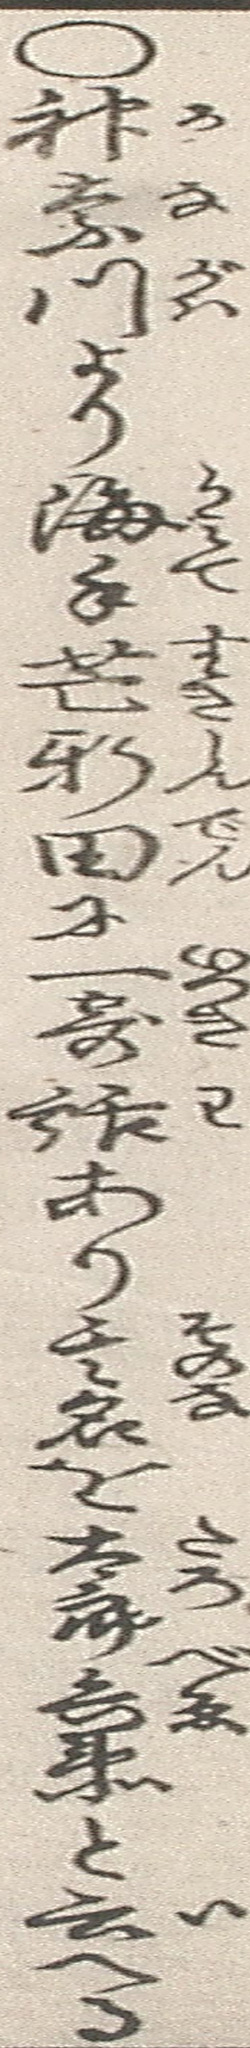◯神奈川より海手芒新田に一奇話あり其名を太郎兵衛と云へる
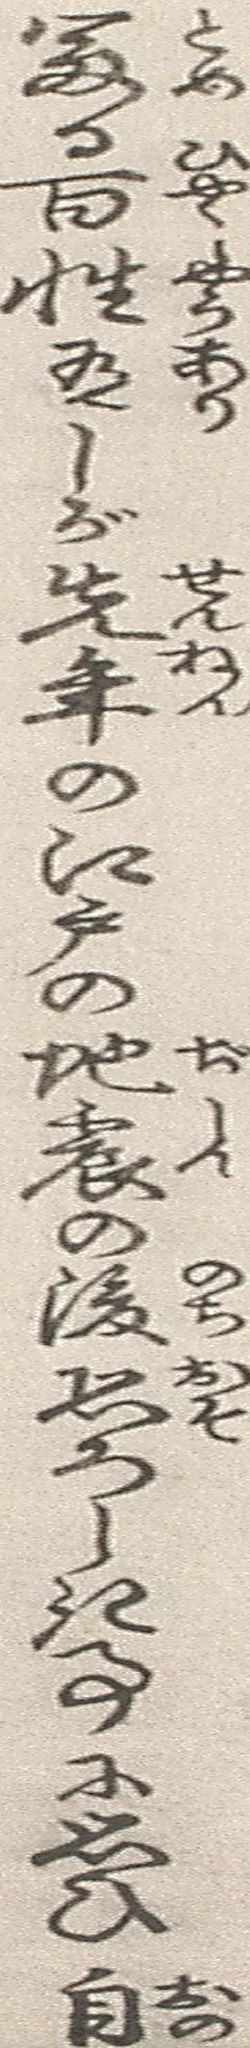冨る百性有しが先年の江戸の地震の後恐ろしき事に思ひ自
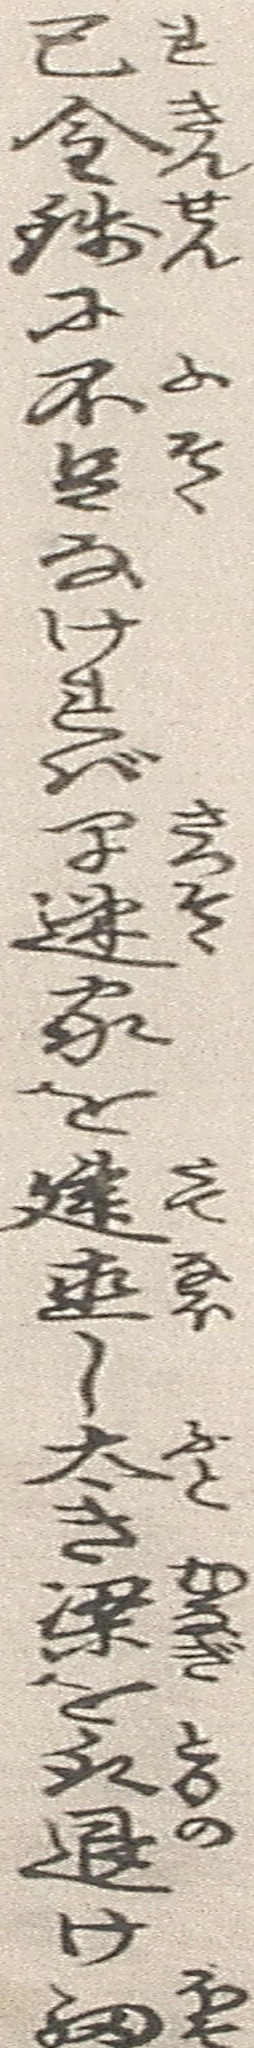己金銭に不足なけれバ早速家を建直し太き梁を取退け細
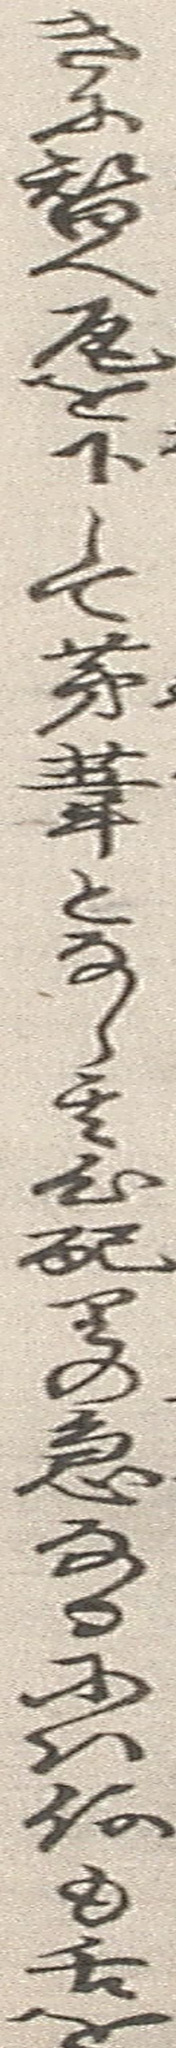きに替へ瓦を下して茅葺となし其心配りの急なるにハ何も舌を
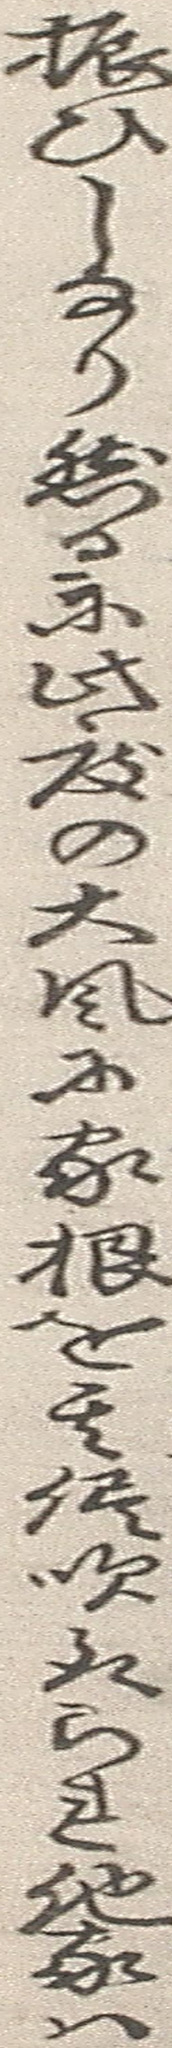振ひしなり然るに今度の大風に屋根を其侭吹取られ他家ハ
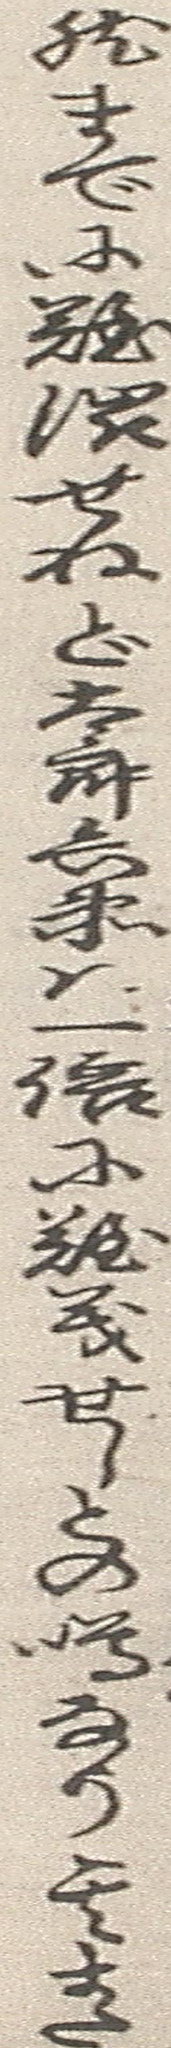然までに難渋せねど太郎兵衛ハ一倍に難義せしとの噂なり其また
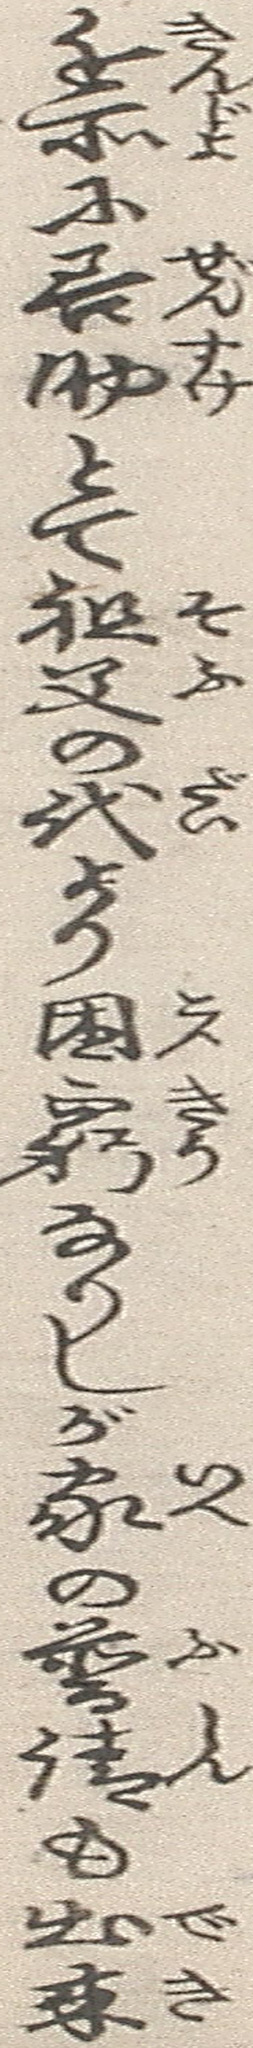近所に善助とて祖父の代より困窮なりし家の普請も出来
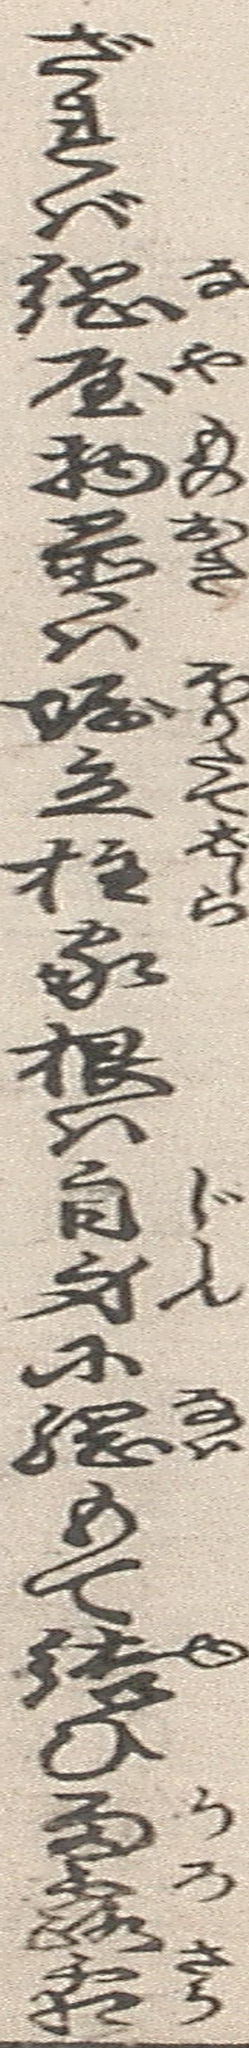ざれバ縄屋物置ハ掘立柱家根ハ自身に繩もて結ひ雨露霜
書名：安政風聞集　上中下　全
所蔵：東京大学地震研究所図書室 Earthquake Research Institute Library, The University of Tokyo, JAPAN
